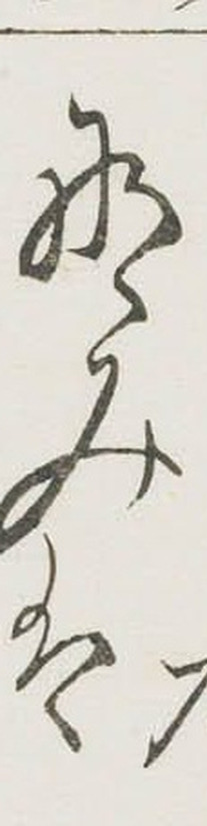なみは
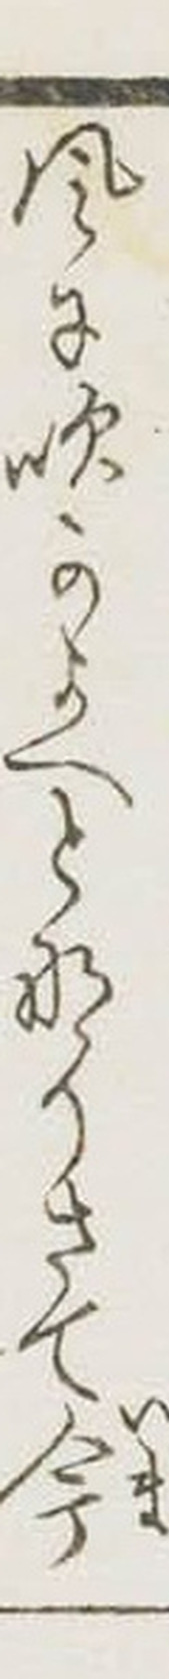風に吹かよへとなりさて今
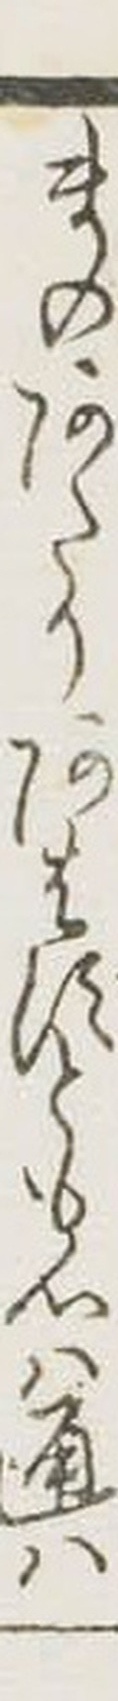まのあたりあはずとも心は通は
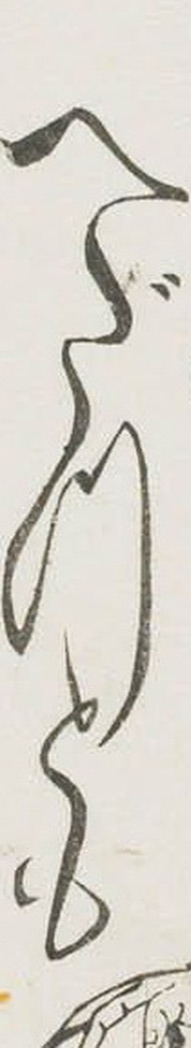へだつとも
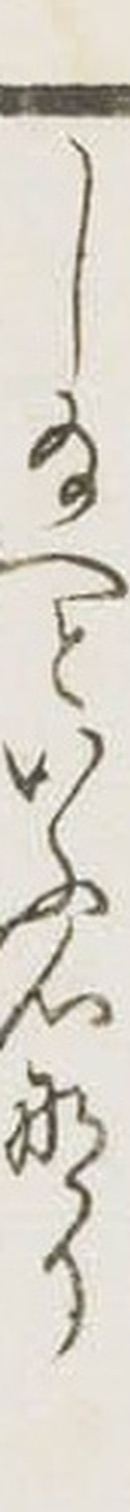し給へといふ心なり
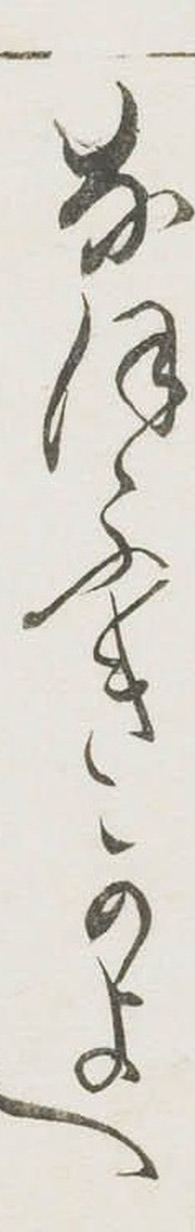なほふきかよへ
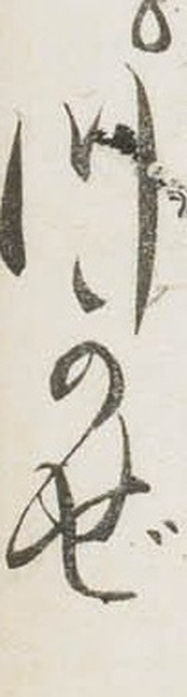川かぜ
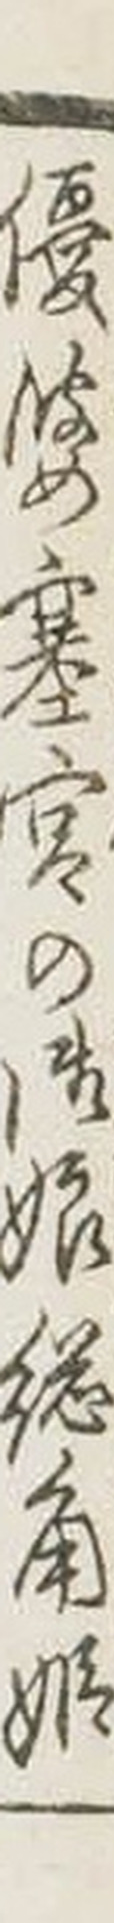優婆塞宮の御娘総角姫
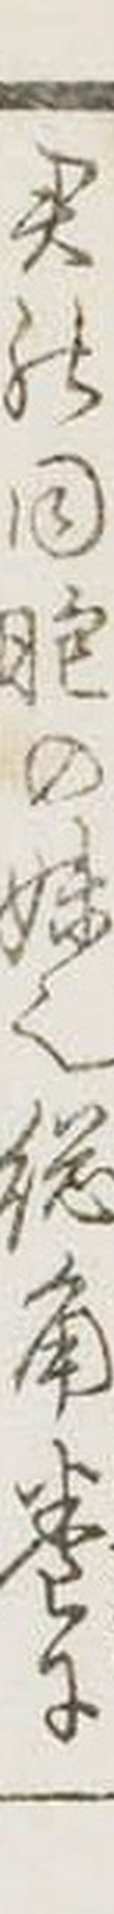君の同胞の妹也総角巻に
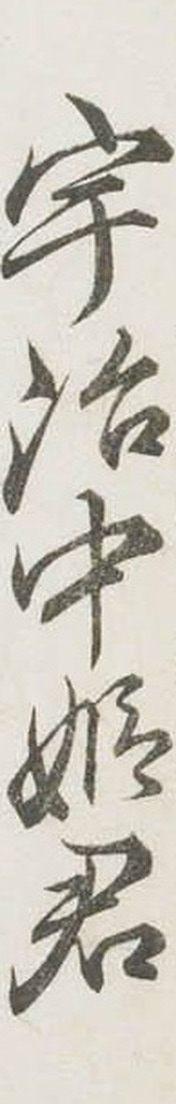宇治中姫君
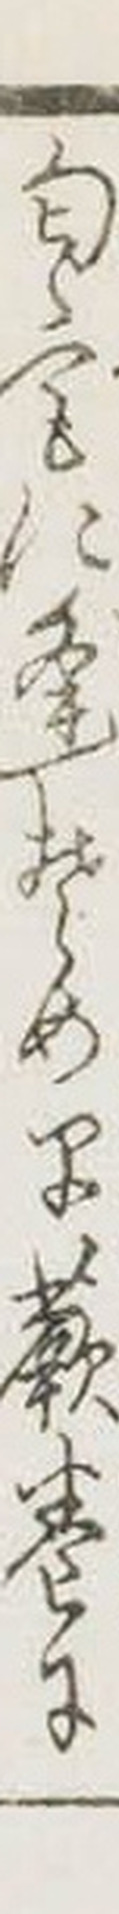匂宮に逢そめ早蕨巻に
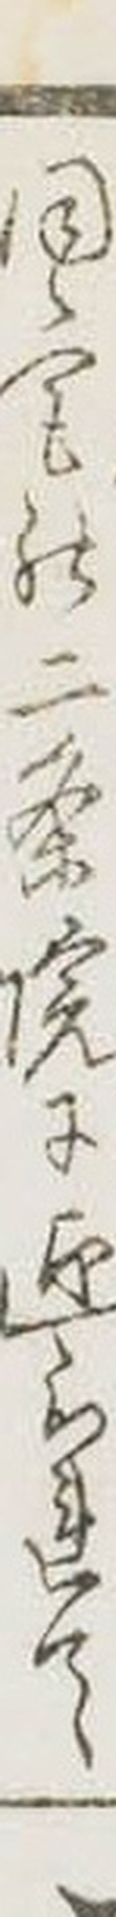同宮の二条院に迎られて
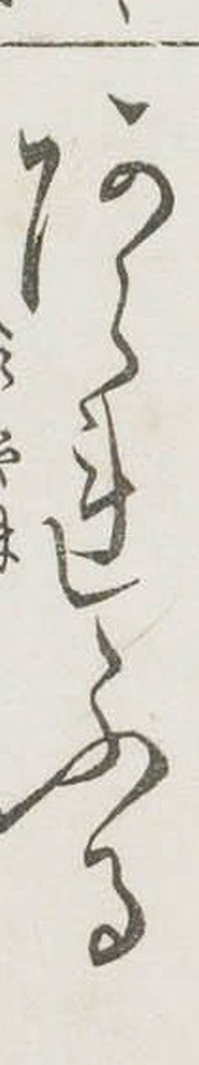あられふる
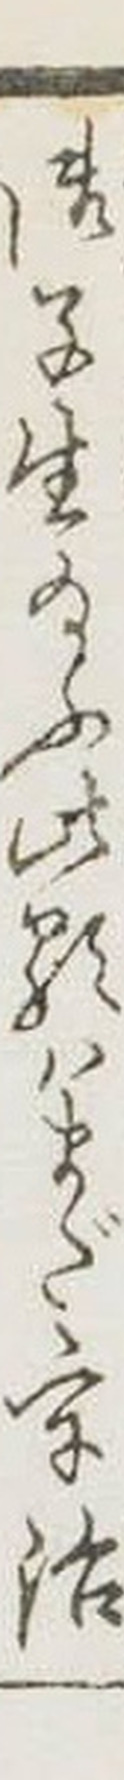御子生給ふ此歌はまだ宇治
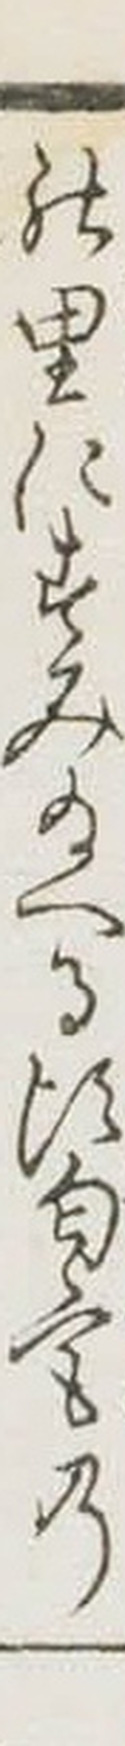の里にすみ給へる頃匂宮の
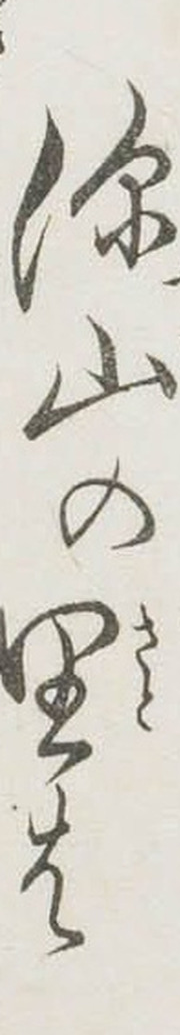深山の里は
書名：源氏百人一首
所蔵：東京学芸大学教育コンテンツアーカイブ
